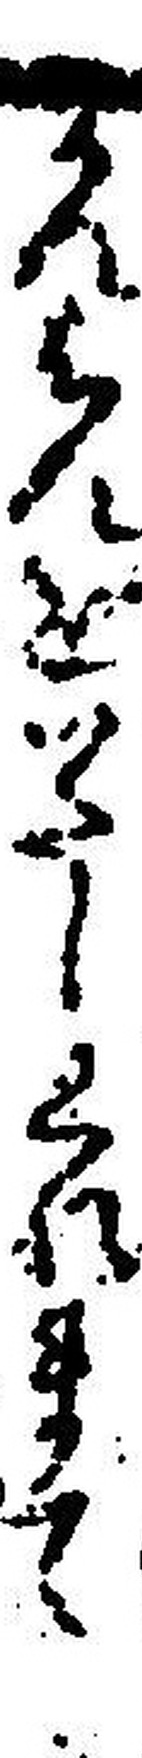かんはんをいたしこれまて
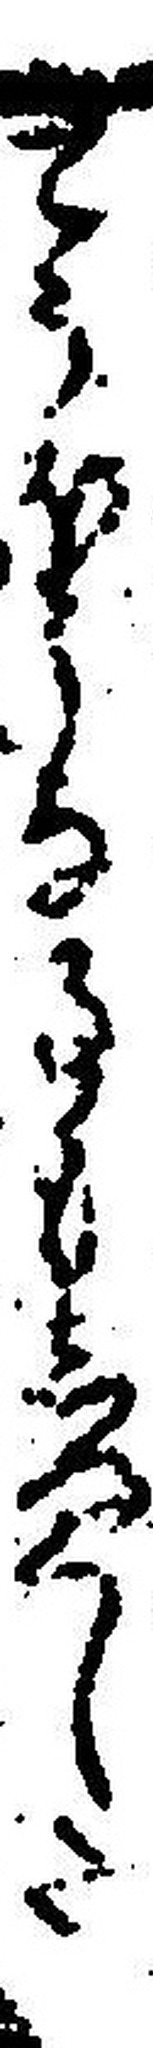てうほうな事もしつくした
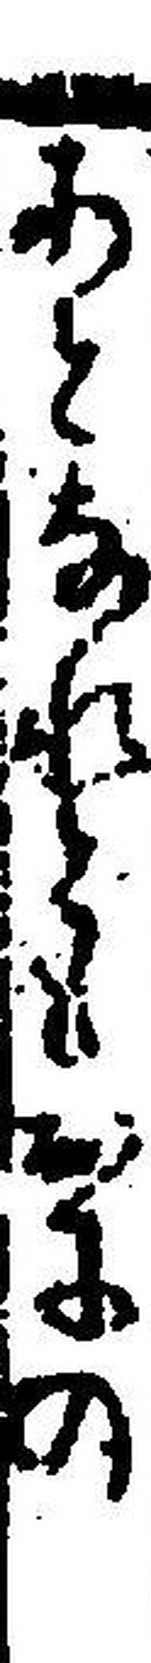あとなれともおにも
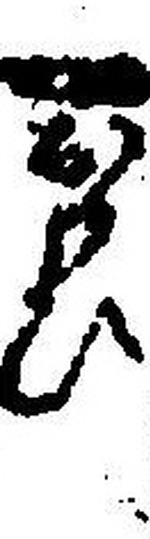おもひ
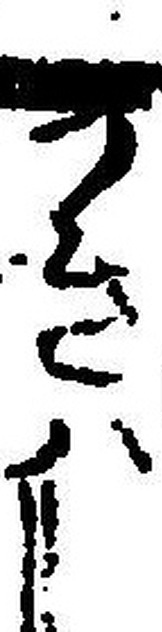つきは
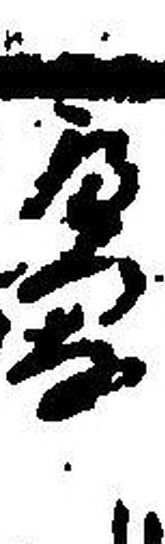へつな
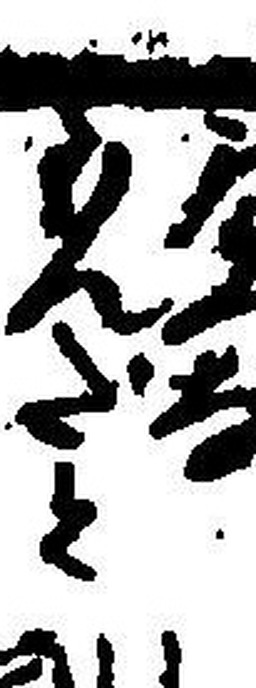もんだと
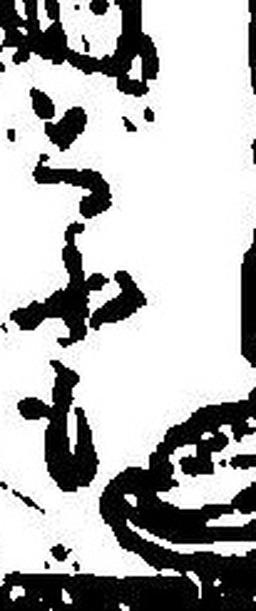どふも
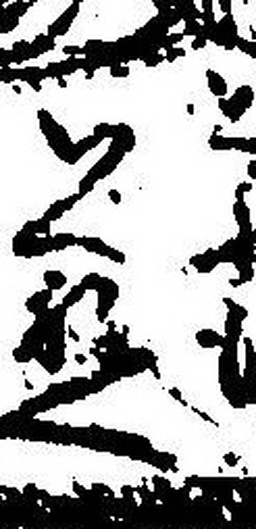いへねへ
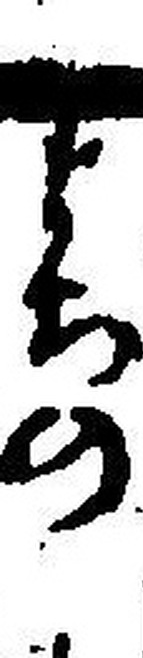まちの
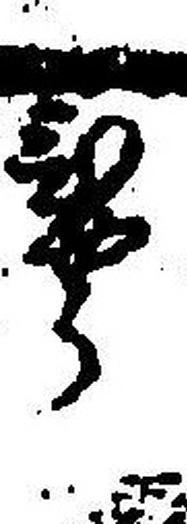ひやう
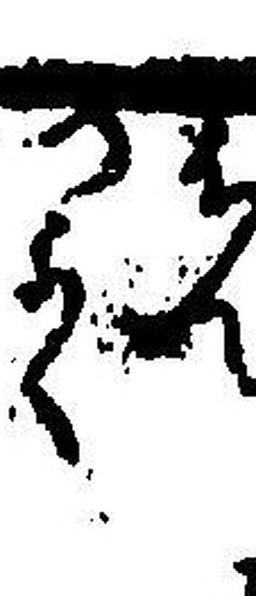つよく
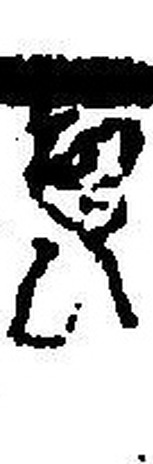おもひ
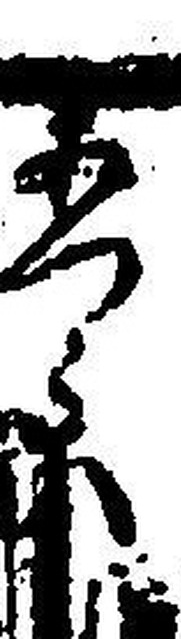あつらい

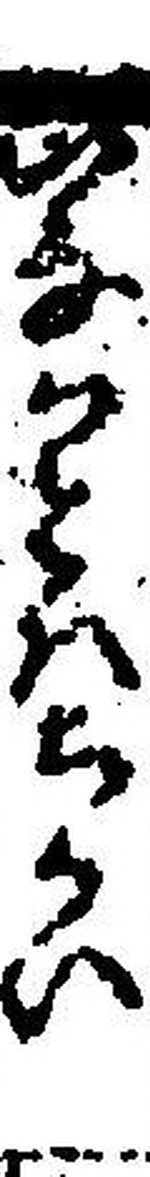いなかとはちかい
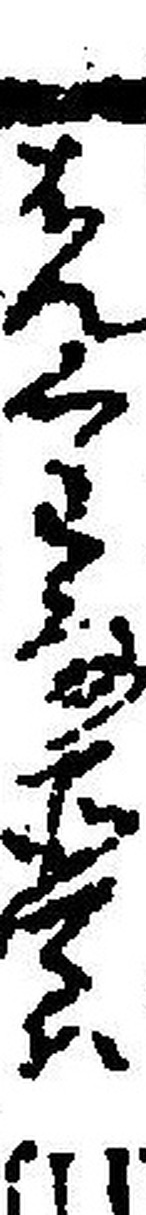はんくわな所ては
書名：天竺儲之筋 / 市場通笑作
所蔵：東京大学総合図書館 General Library in the University of Tokyo, JAPAN
